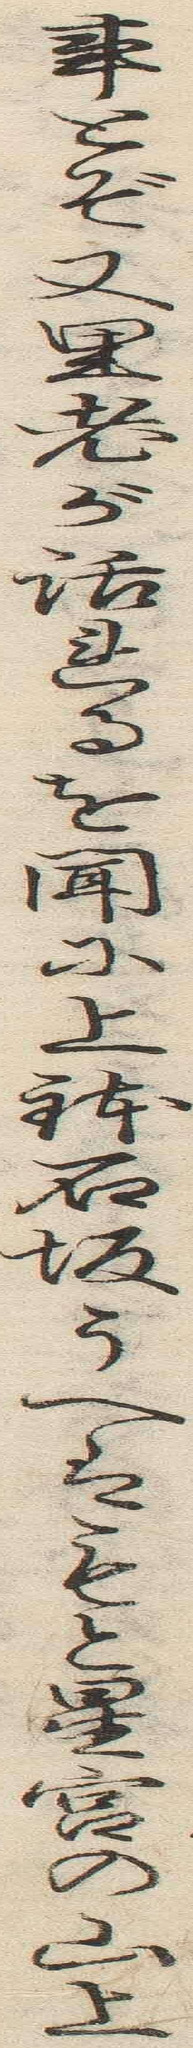事とぞ又里老が話れるを聞に上鉢石坂うへはもと星宮の山上
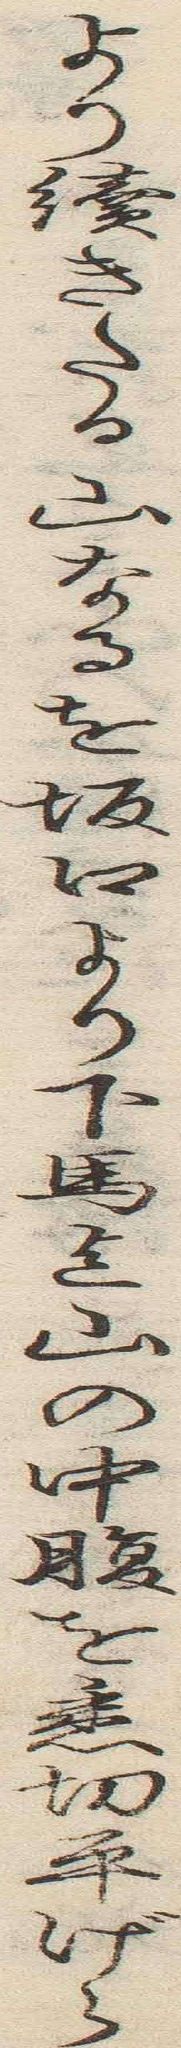より續きたる山なるを坂口より下馬迠山の中腹を悉切平げら
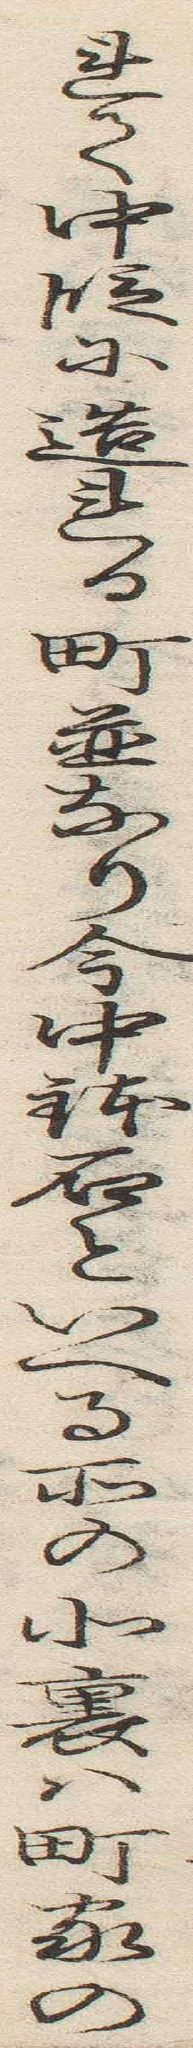れて中段に造れる町並なり今中鉢石といへる所の北裏は町家の
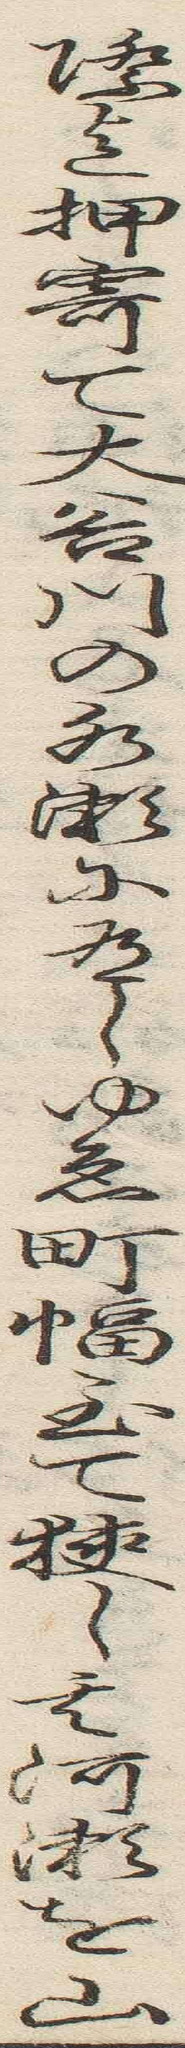際迠押寄て大谷川の水瀬に有しゆゑ町幅至て狹し其河瀬を山
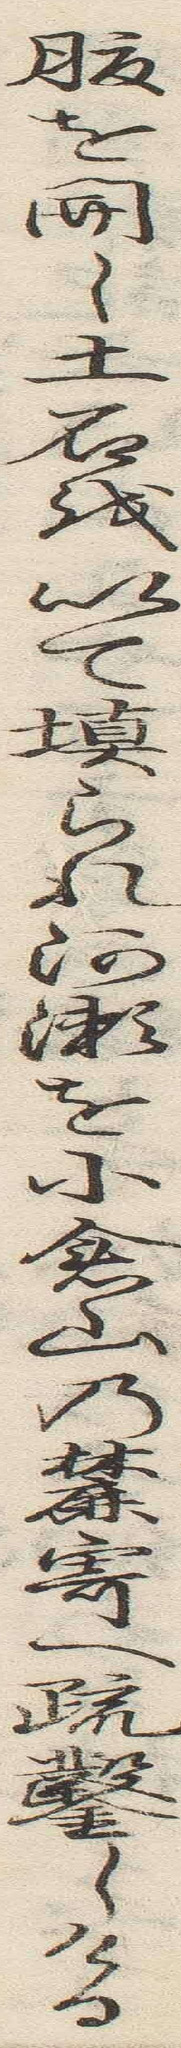腹を開し土石を以て填られ河瀬を小倉山の麓寄へ疏鑿しける
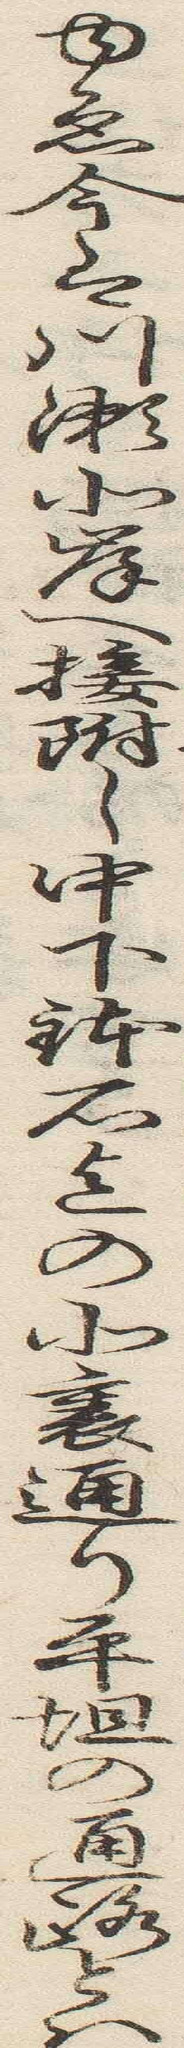ゆゑ今は川瀬北岸へ接附し中下鉢石迠の北裏通り平坦の通路とは
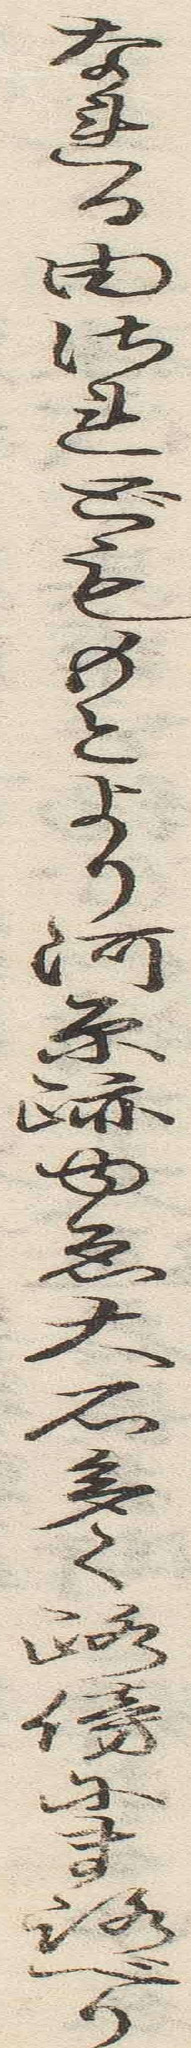なれる由されどももとより河原跡ゆゑ大石多く路傍にまろべり
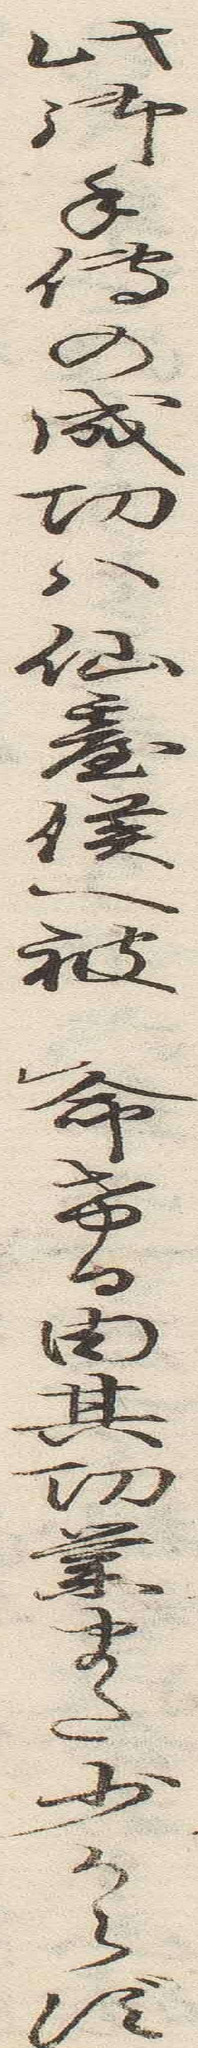此御手傳の成㓛は仙臺侯へ被命ける由其㓛業また少からず
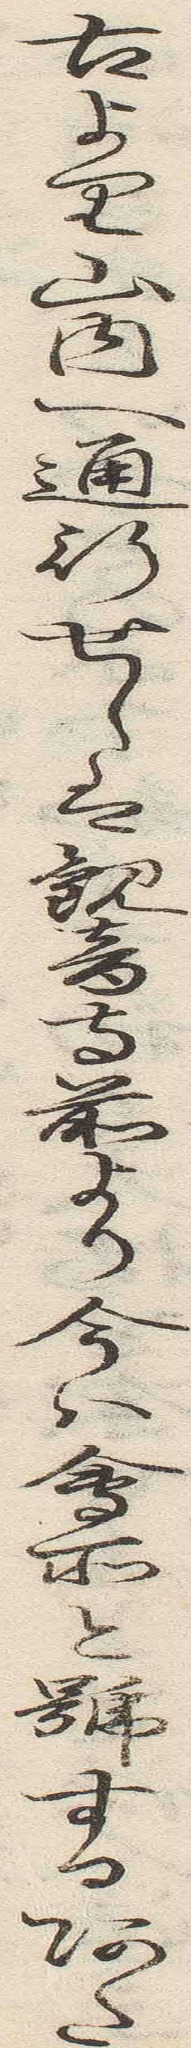古より山内へ通行せしは観音寺前より今は會所と號するあた
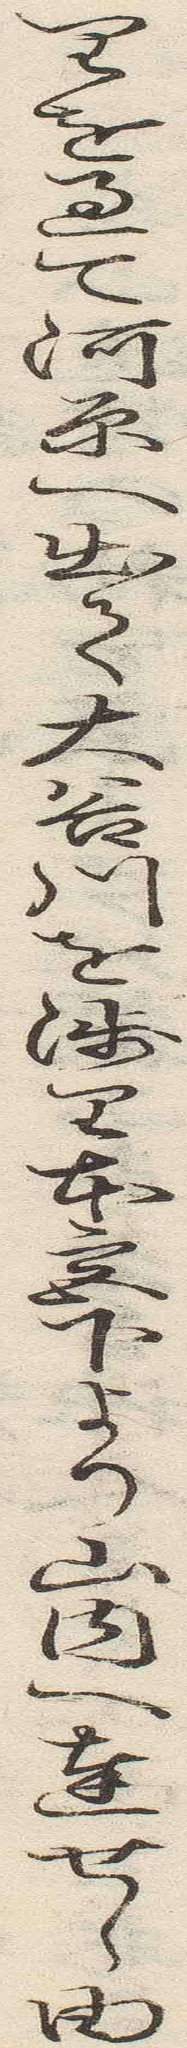りを過て河原へ出て大谷川を渉り本宮下より山内へ達せし由
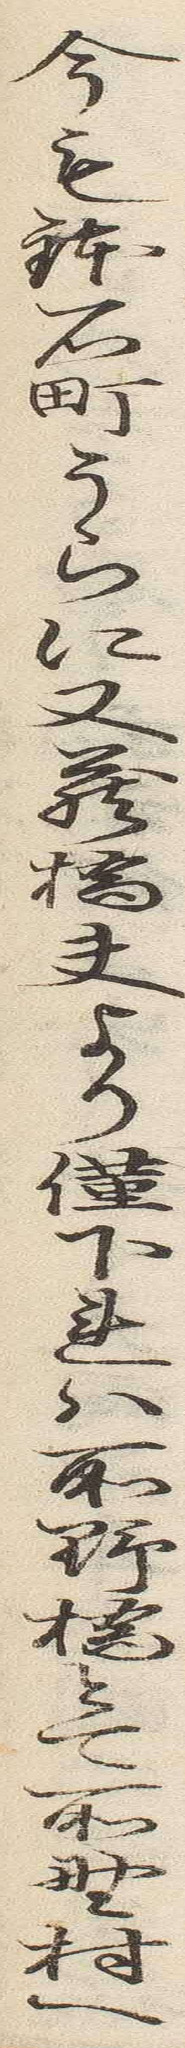今も鉢石町うらに又蔵橋夫より僅下れは所野橋とて所㙒村へ
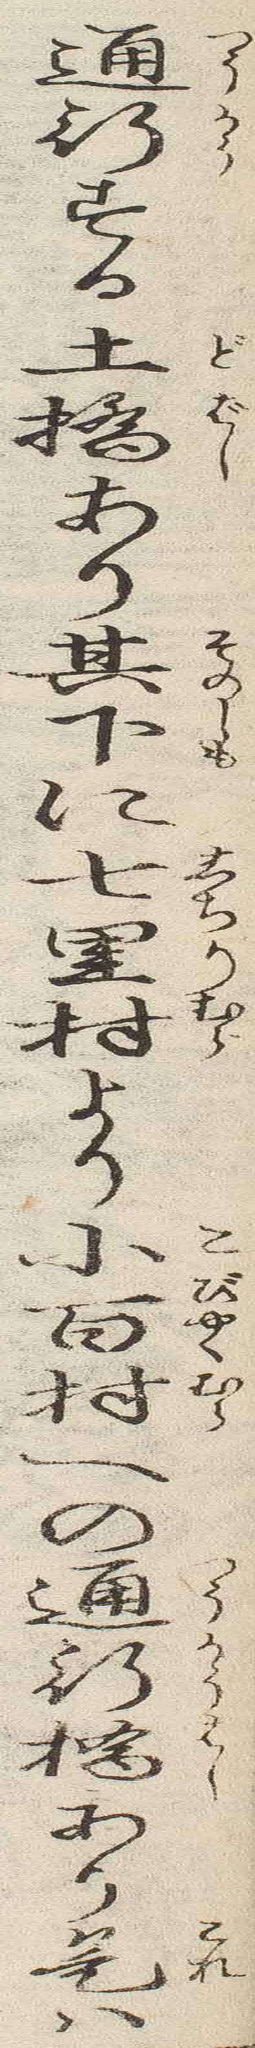通行する土橋あり其下に七里村より小百村への通行橋あり是は
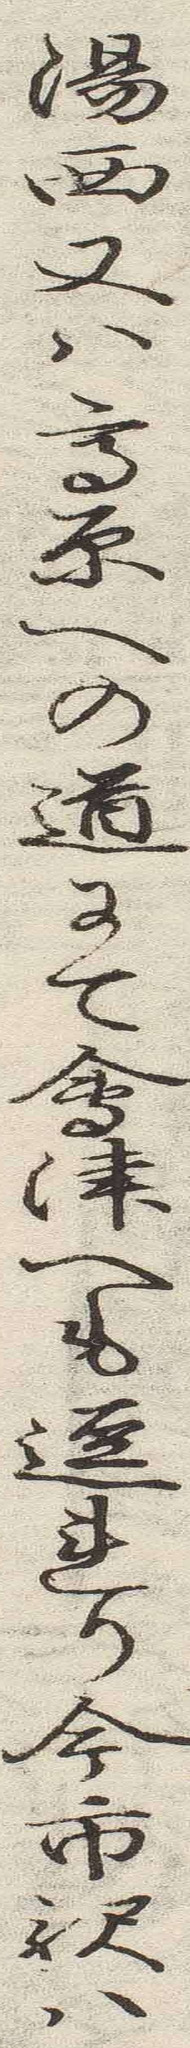湯西又は高原への道にて會津へも逗れり今市駅は
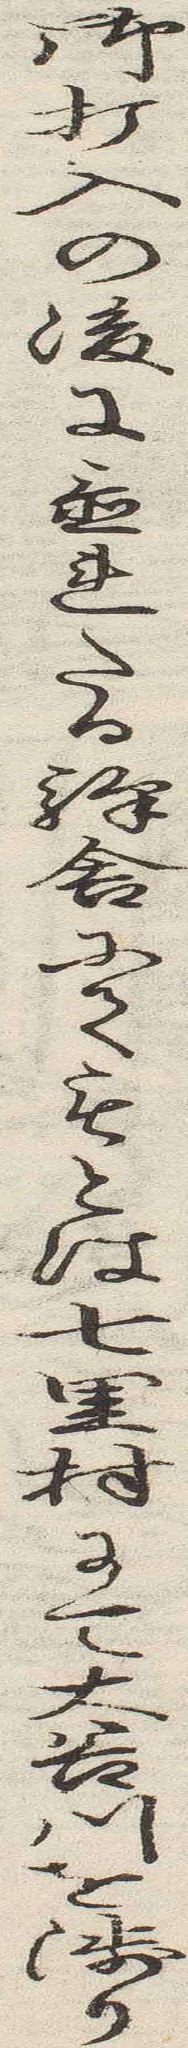御打入の後に置れたる驛舎にてもとは七里村にて大谷川を渉り
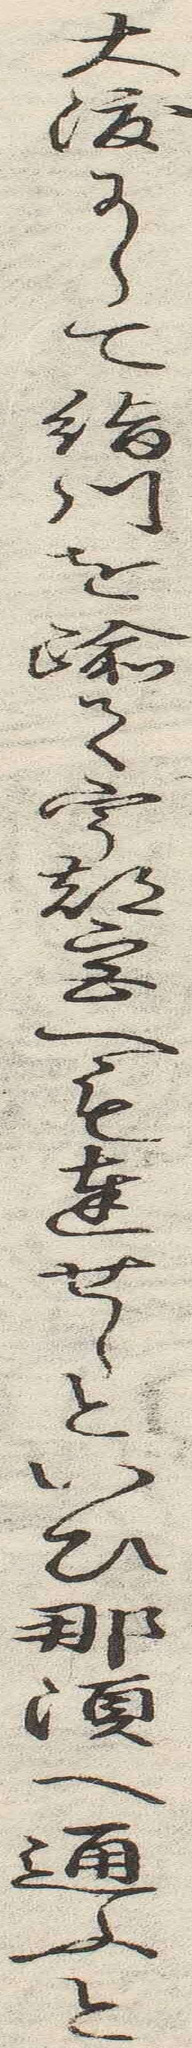大渡にして絹川を踰て宇都宮へも達せしといひ那須へ通ふと
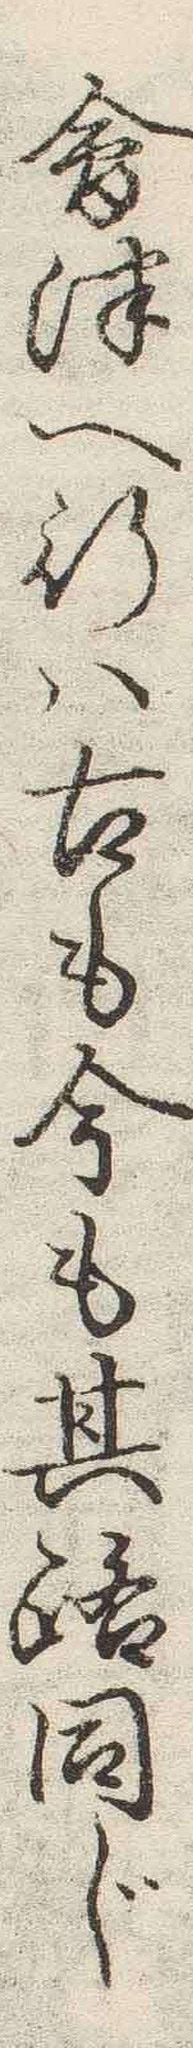會津へ行は古も今も其路同じ
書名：日光山志
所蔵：東京学芸大学附属図書館 国文学研究資料館
